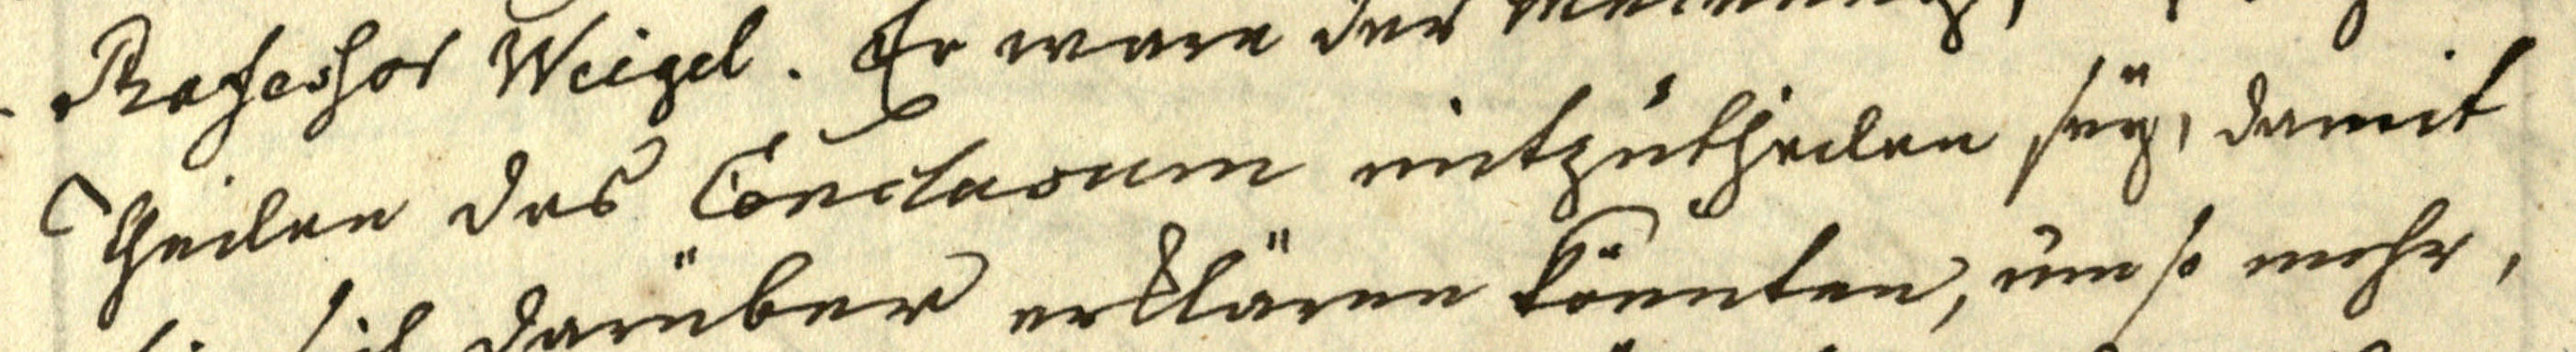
Theilen das Conclusum mitzutheilen seÿ, damit
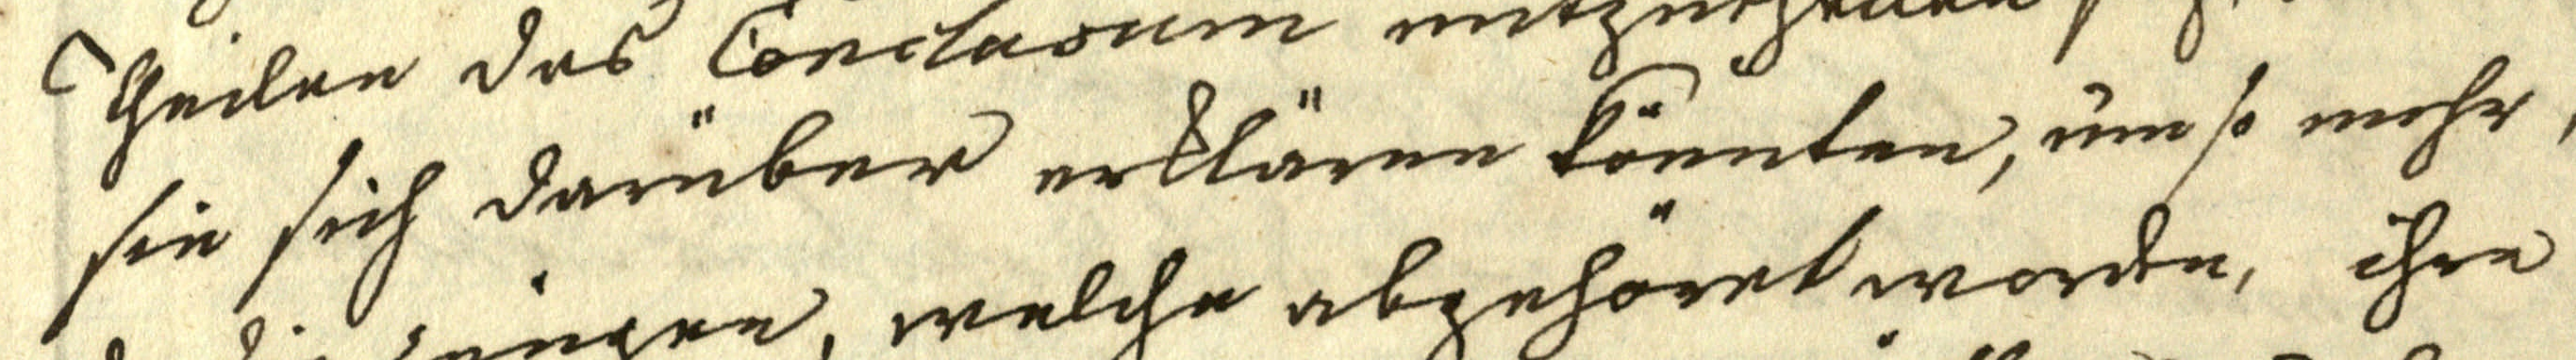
sie sich darüber erklären könnten, um so mehr,
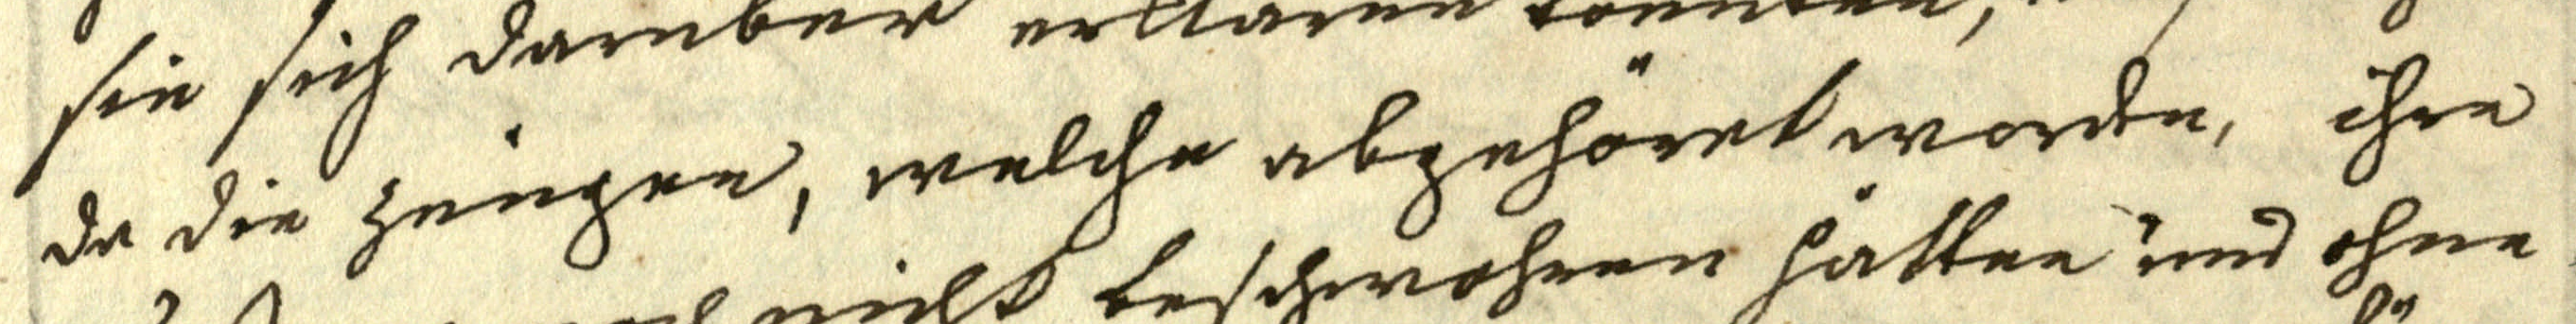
da die Zeugen, welche abgehöret worden, ihre
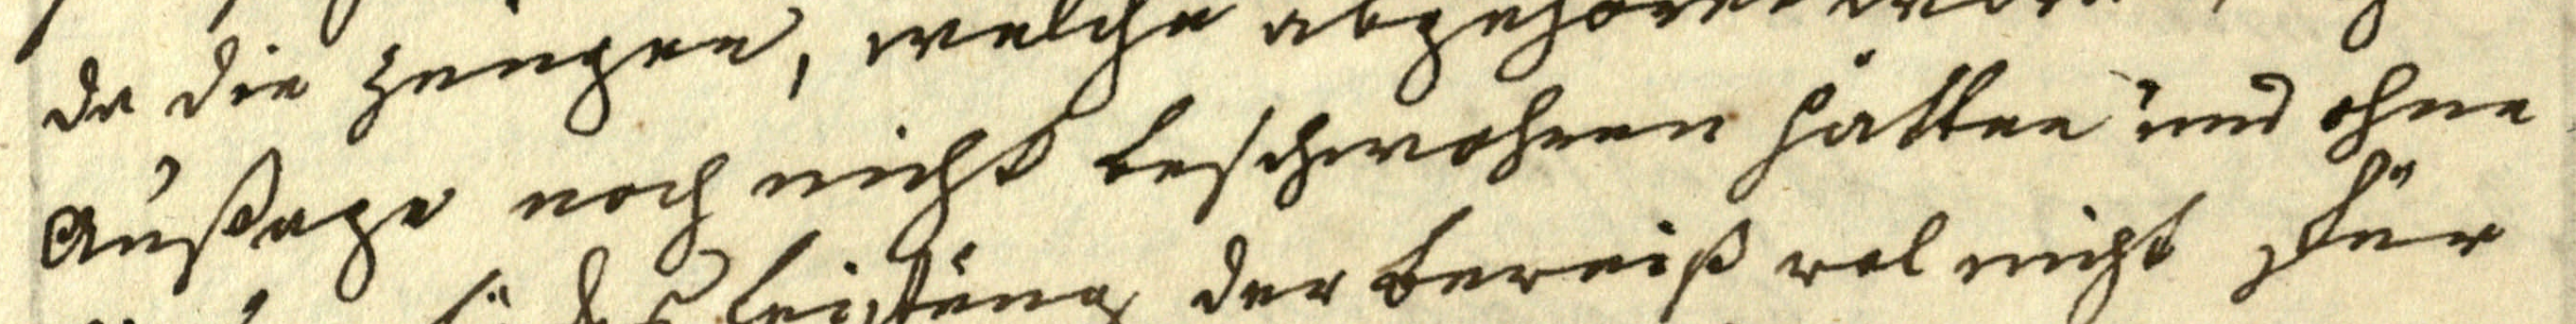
Aussage noch nicht beschwohren hätten und ohne
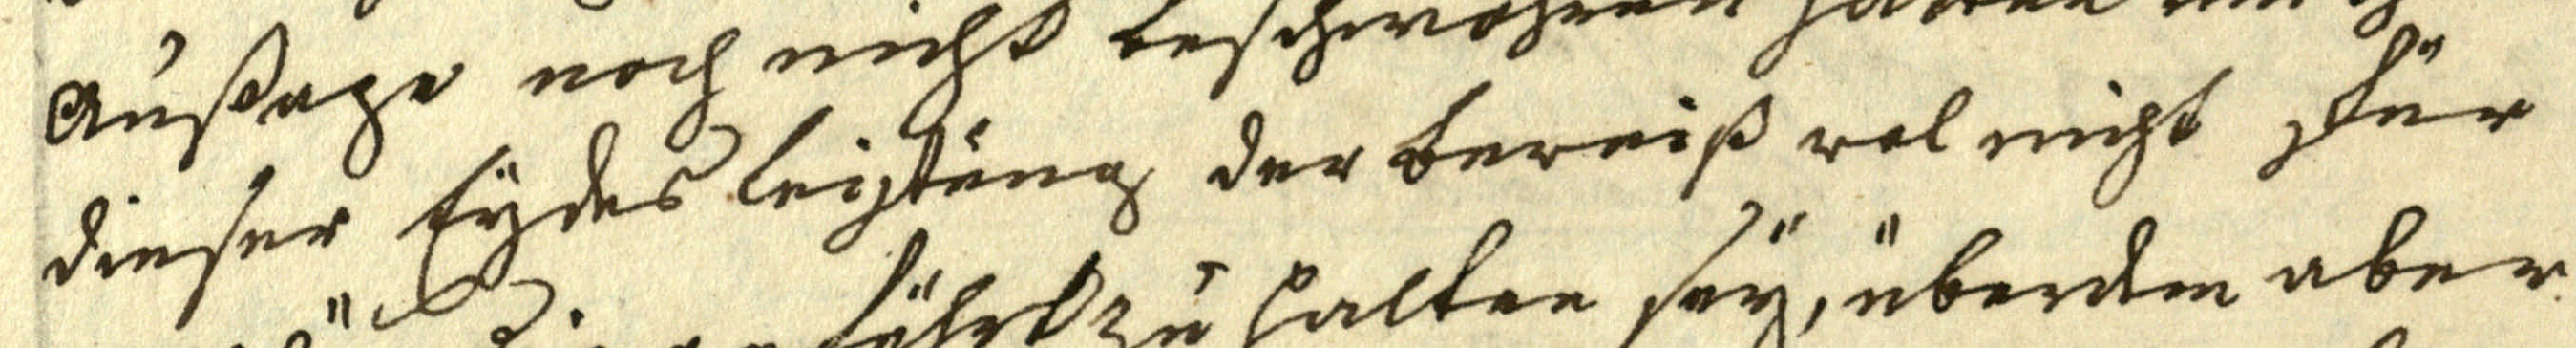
dieser Eÿdes leistung der Beweiß wol nicht für
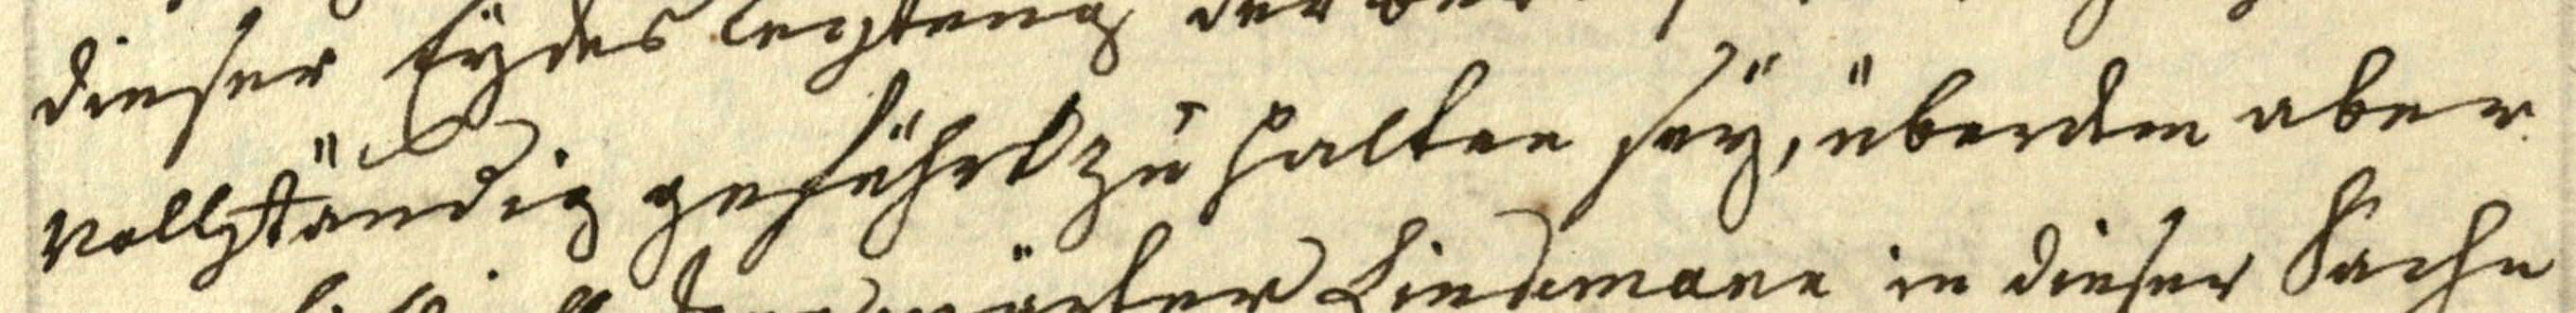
vollständig geführt zu halten seÿ, überdem aber
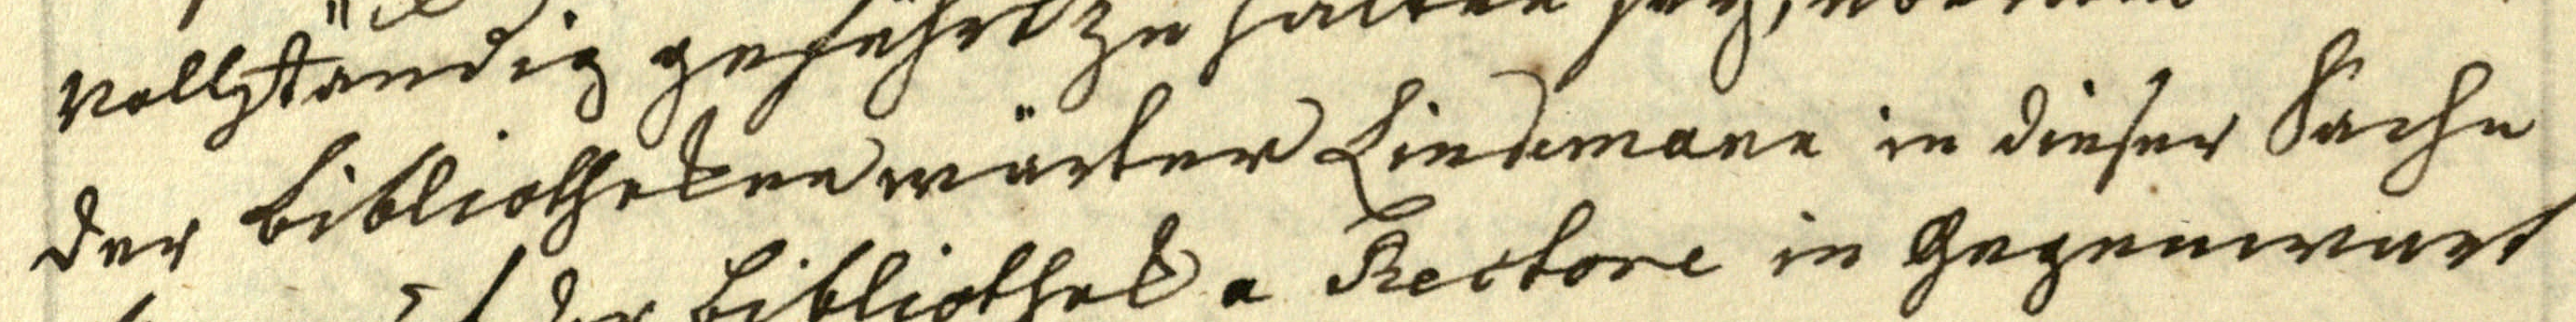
der Bibliothekenwärter Lindemann in dieser Sache
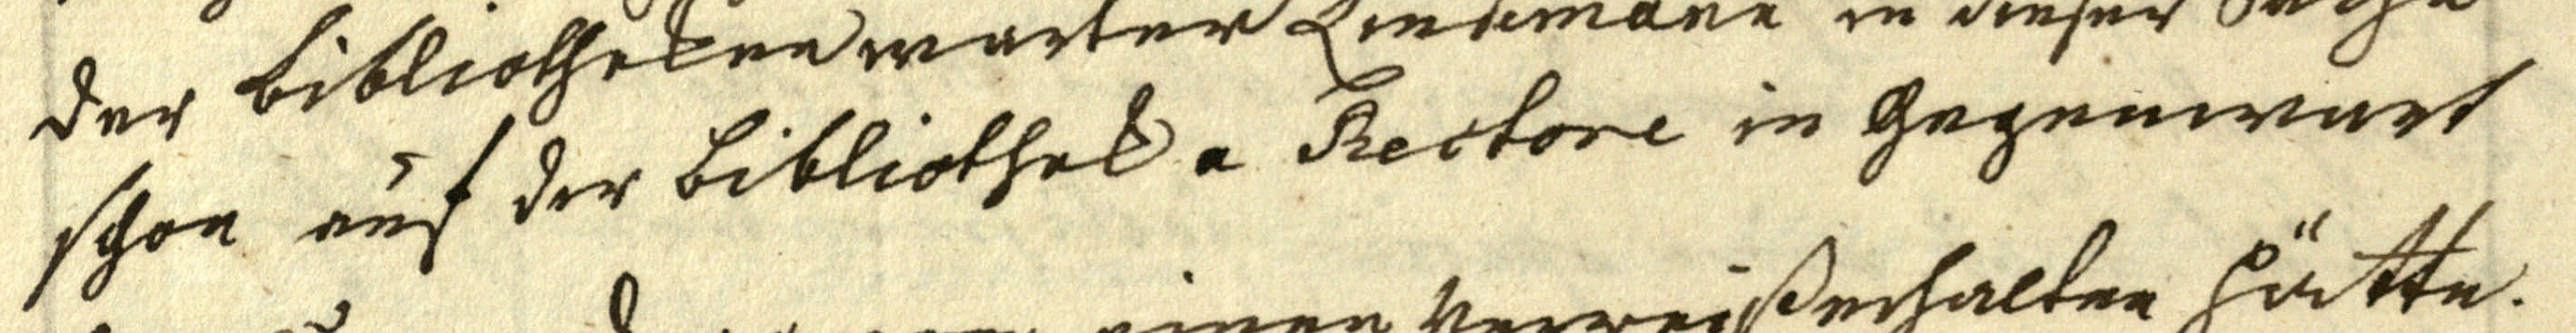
schon auf der Bibliothek a Rectore in Gegenwart
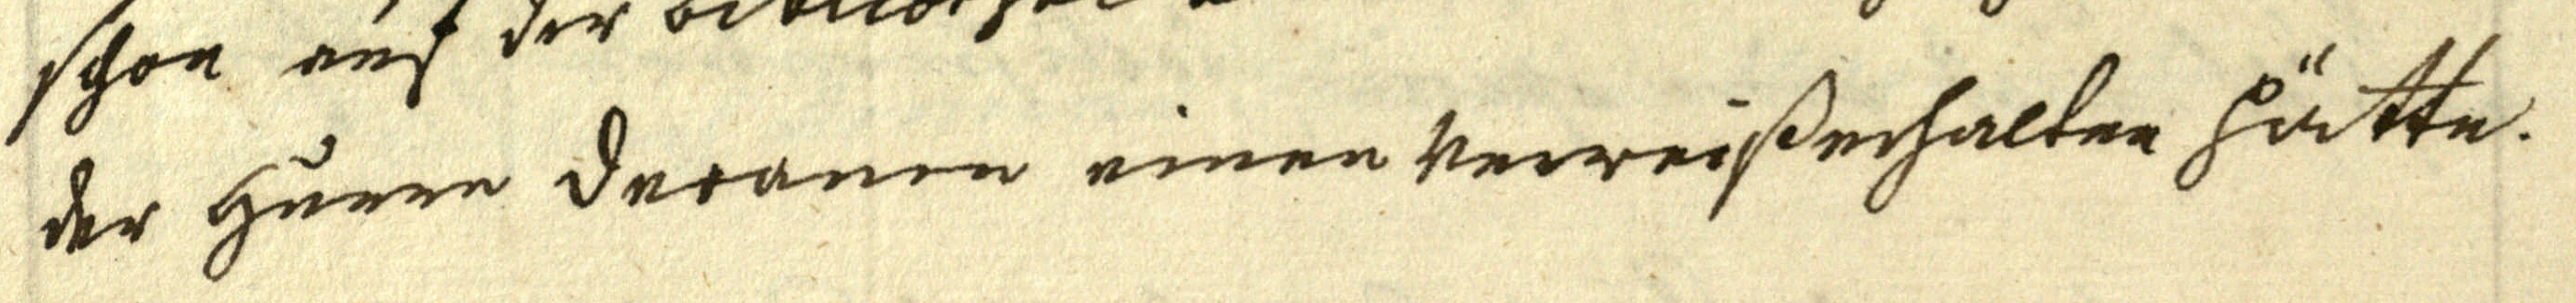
der Herrn Decanen einen Verweiß erhalten hätte.
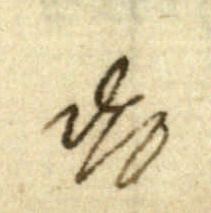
dh
